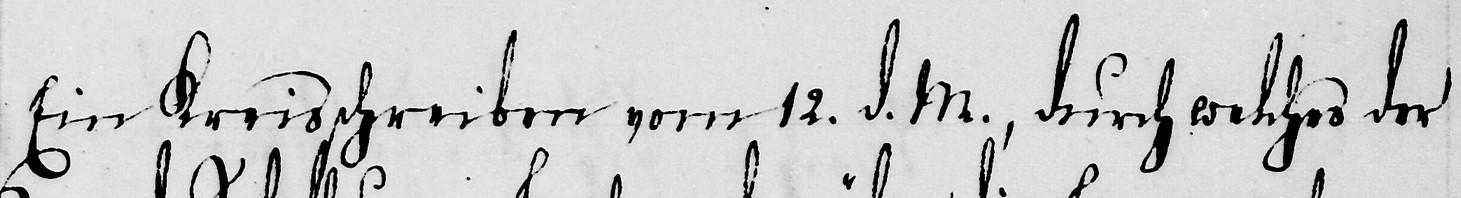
Ein Kreisschreiben vom 12. d. M., durch welches der
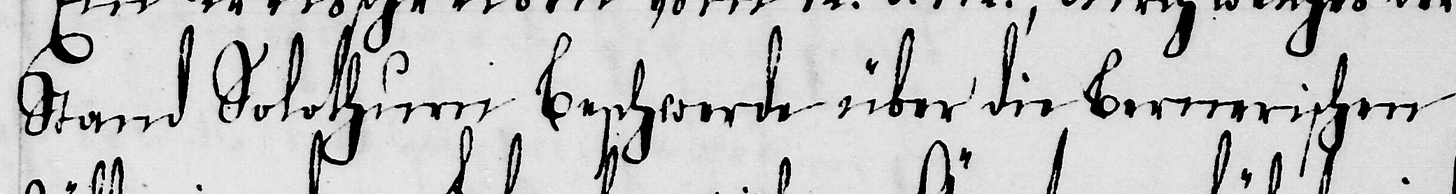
Stand Solothurn Beschwerde über die Bernischen
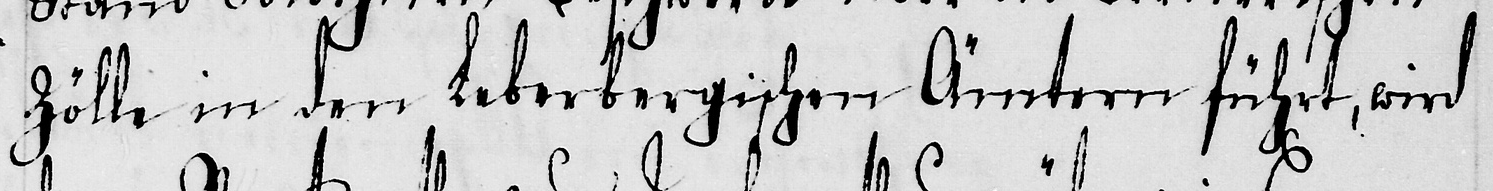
Zölle in den Leberbergischen Ämtern führt, wird
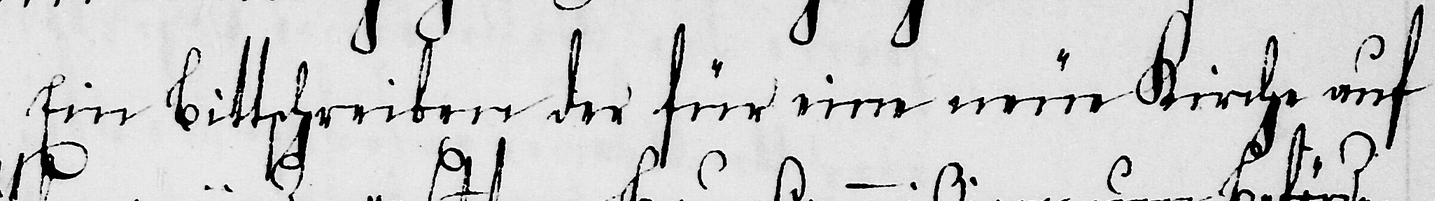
Ein Bittschreiben der für eine neue Kirche auf
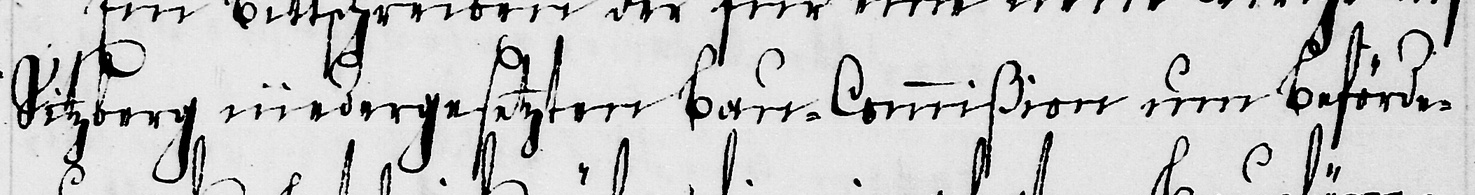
Sitzberg niedergesetzten Bau-Commißion um Beförde¬
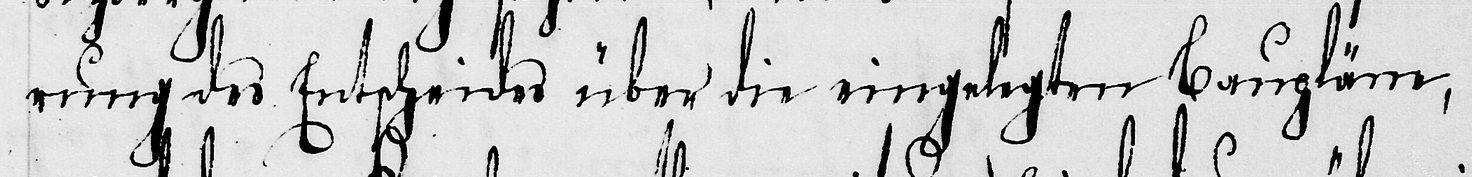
rung des Entscheides über die eingelegten Baupläne,
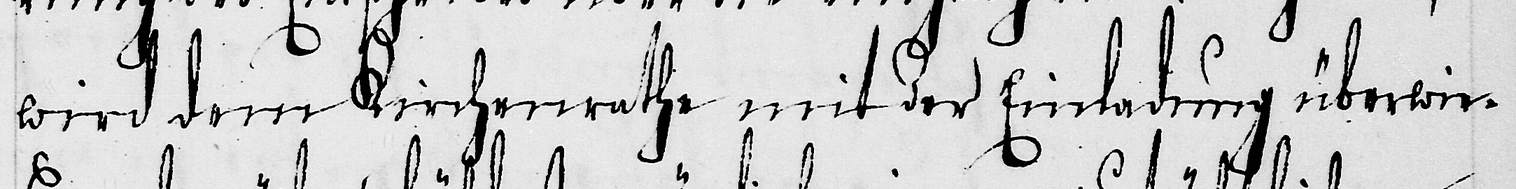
wird dem Kirchenrathe mit der Einladung überwie¬
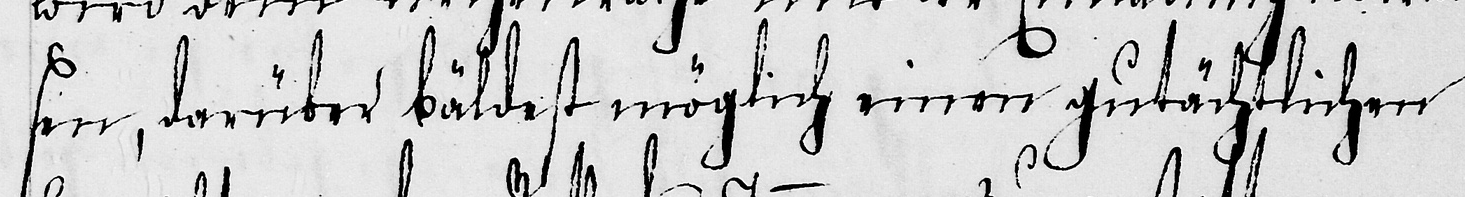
sen, darüber bäldest möglich einen gutächtlichen
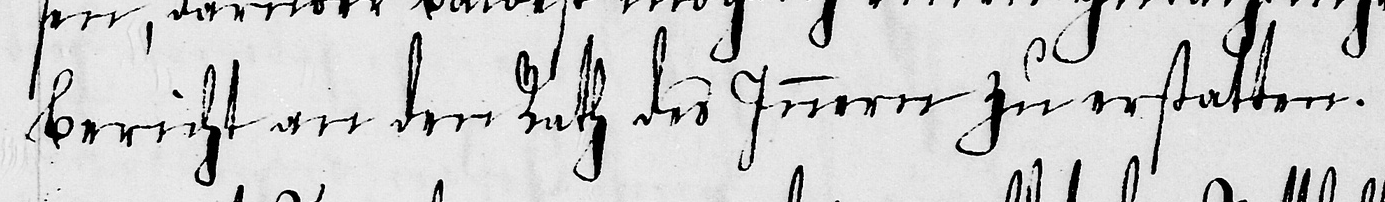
Bericht an den Rath des Innern zu erstatten.
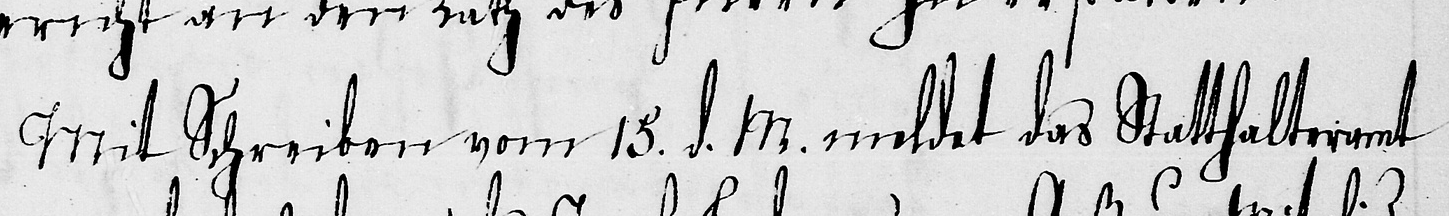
Mit Schreiben vom 15. d. M. meldet das Statthalteramt
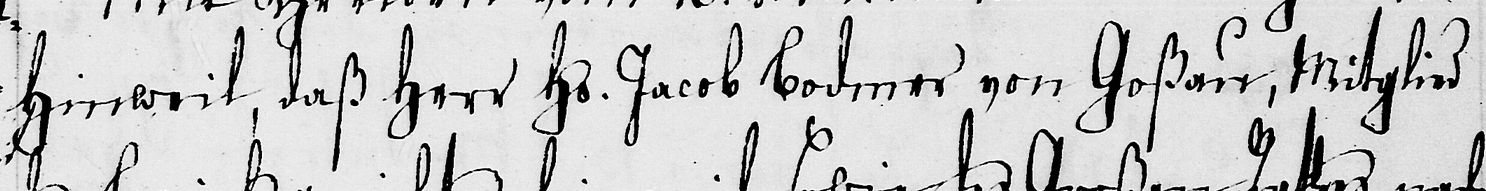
Hinweil, daß Herr Hs. Jacob Bodmer von Goßau, Mitglied
